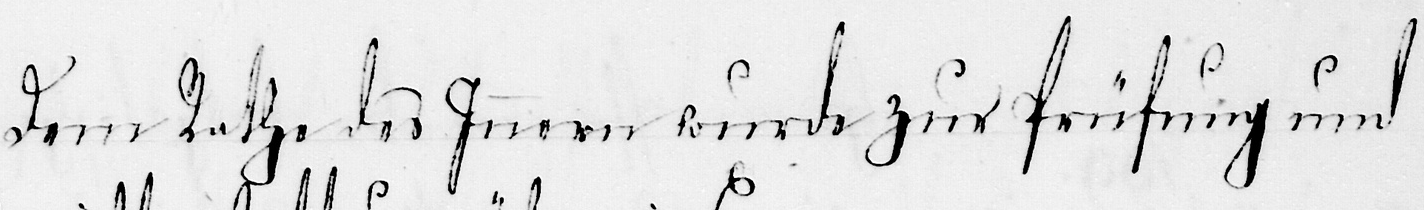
Dem Rathe des Innern wurde zur Prüfung und
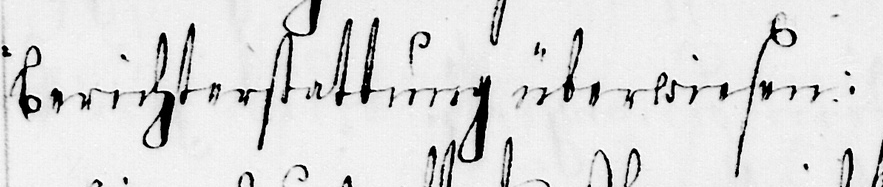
Berichterstattung überwiesen:
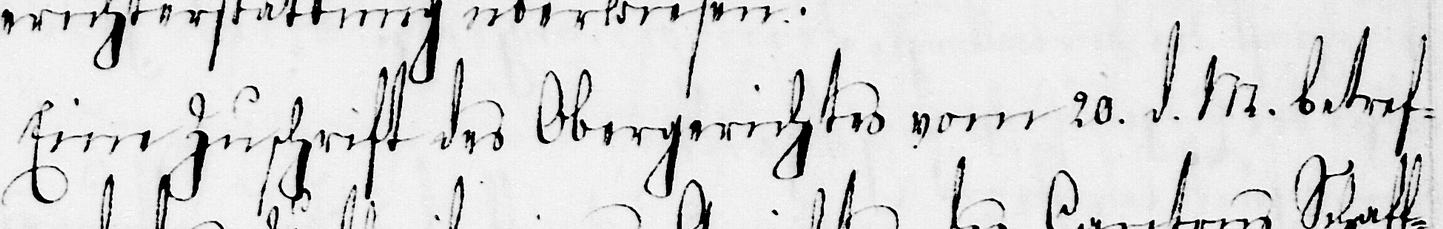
Eine Zuschrift des Obergerichtes vom 20. d. M. betref¬
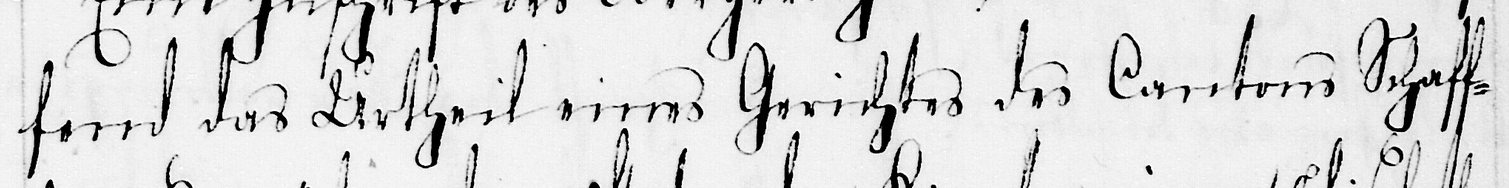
fend das Urtheil eines Gerichtes des Cantons Schaff¬
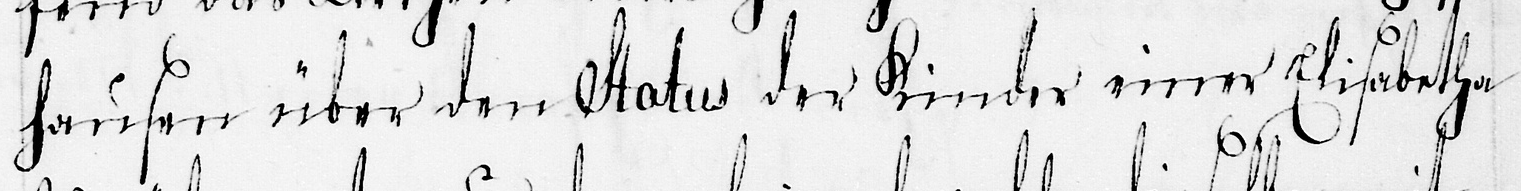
hausen über den Status der Kinder einer Elisabetha
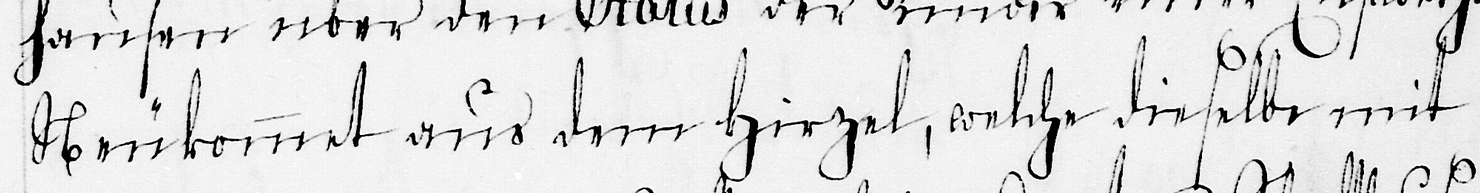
Neukommet aus dem Hirzel, welche dieselbe mit
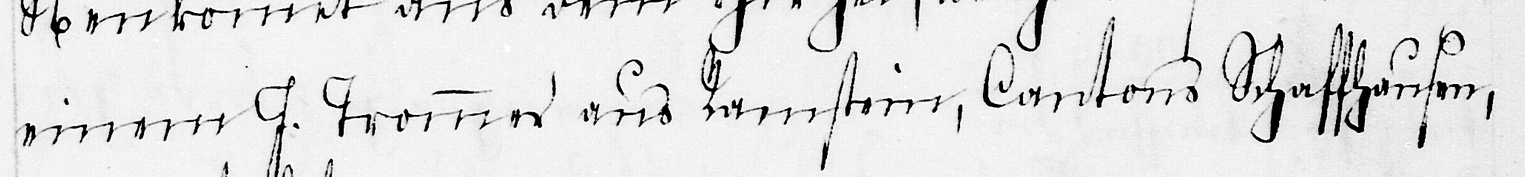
einem J. Trommer aus Ramstein, Cantons Schaffhausen,
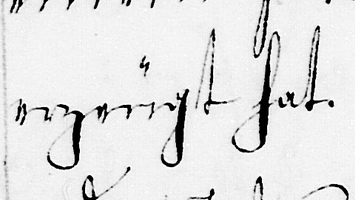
erzeugt hat.
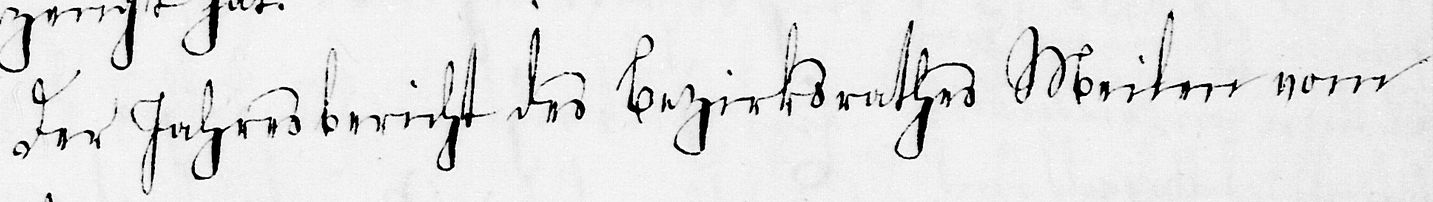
Der Jahresbericht des Bezirksrathes Meilen vom
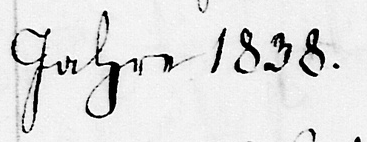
Jahre 1838.
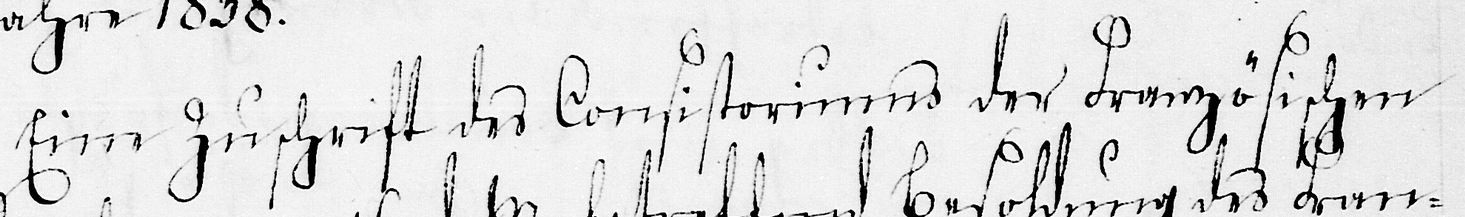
Eine Zuschrift des Consistoriums der Französischen
